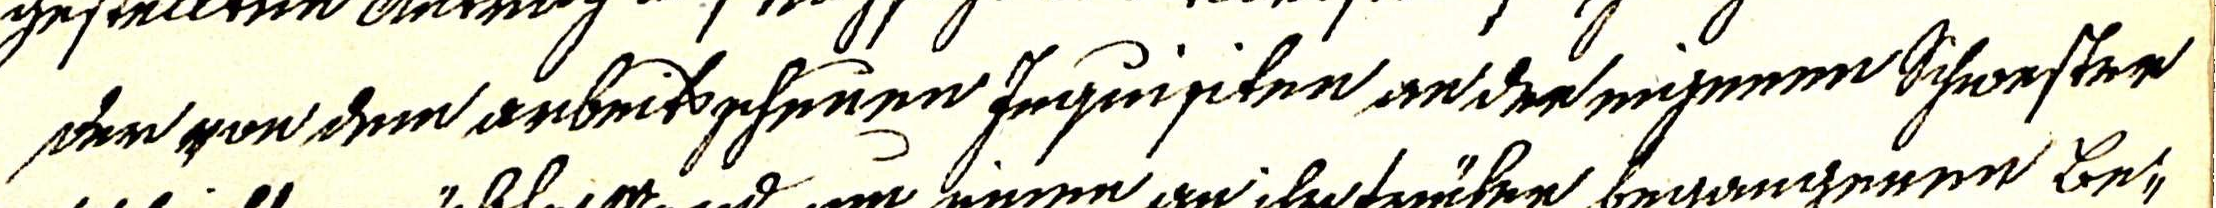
Der von dem arbeitsscheuen Inquisiten an der eigenem Schwester
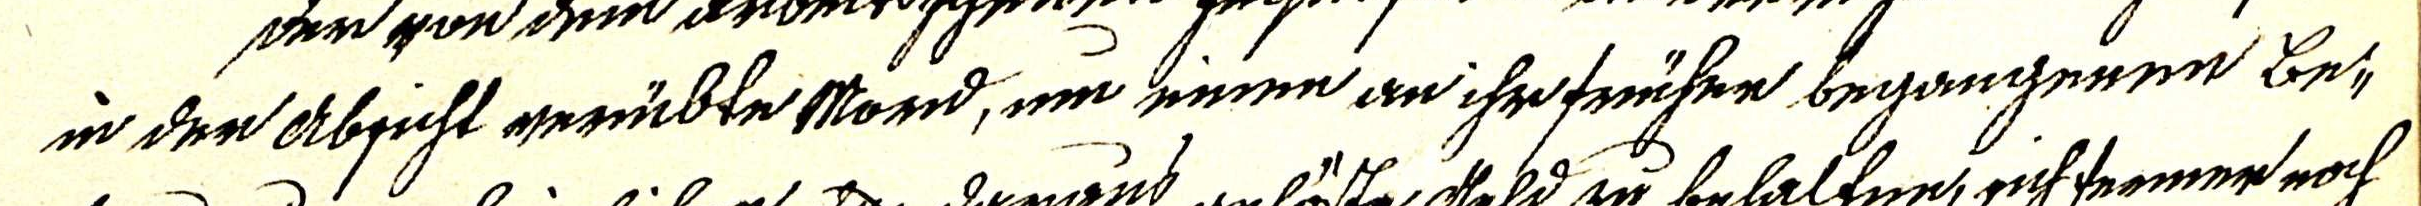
in der Absicht verübte Mord, um einen an ihr früher begangenen Be¬
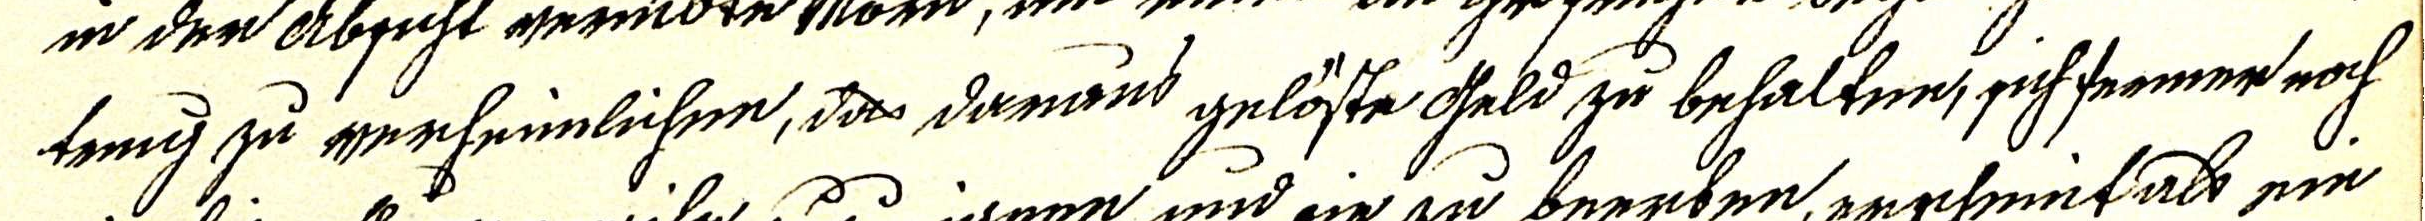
trug zu verheimlichen, das daraus gelöste Geld behalten, sich ferner noch
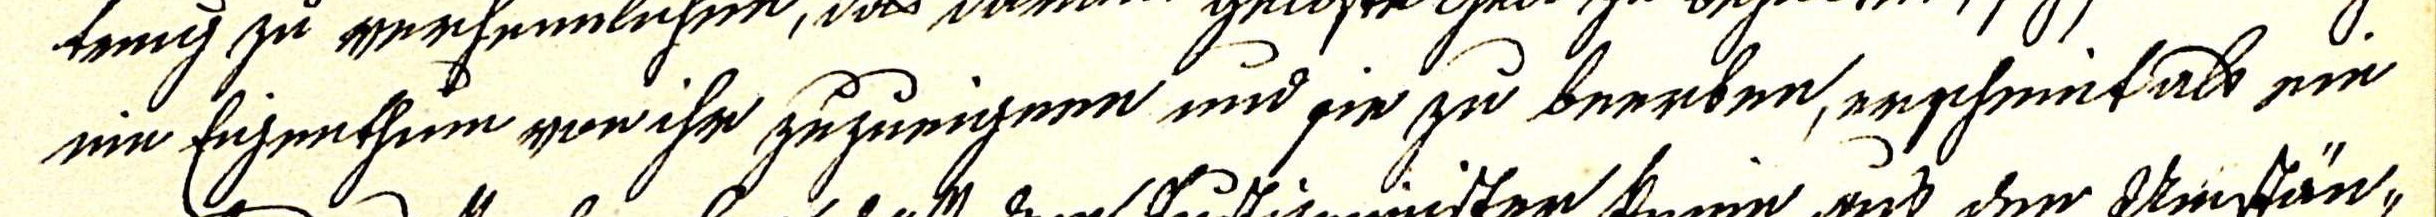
ein Eigenthum von ihr zuzueignen und sie zu beerben, erscheint als ein
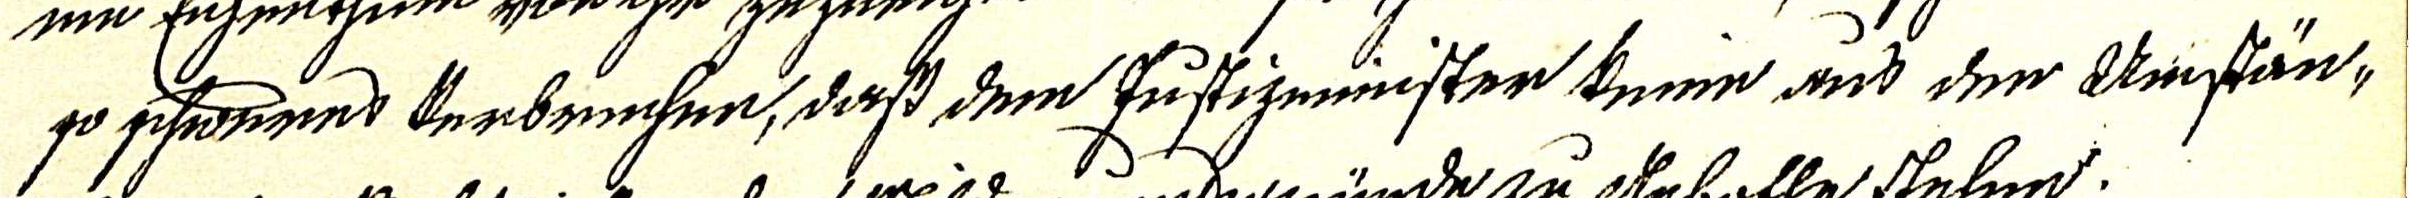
so schweres Verbrechen, daß dem Justizminister keine aus den Umstän¬
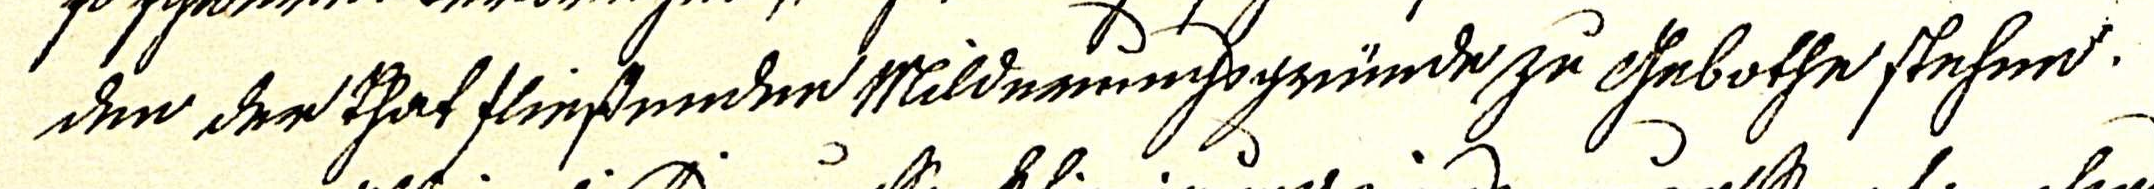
den der That fließenden Milderungsgründe zu Gebothe stehen.
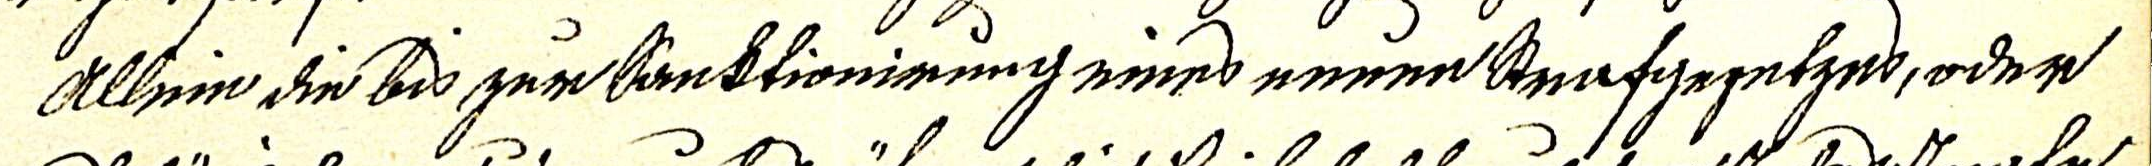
Allein die bis zur Sanktionierung eines neuer Strafgesetzes, oder
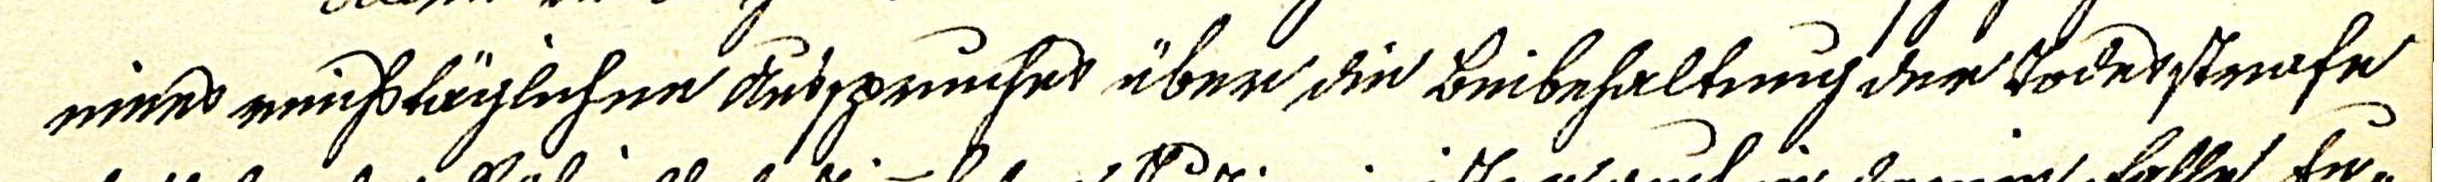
eines reichstäglichen Ausspruches über die Beibehaltung der Todesstrafe
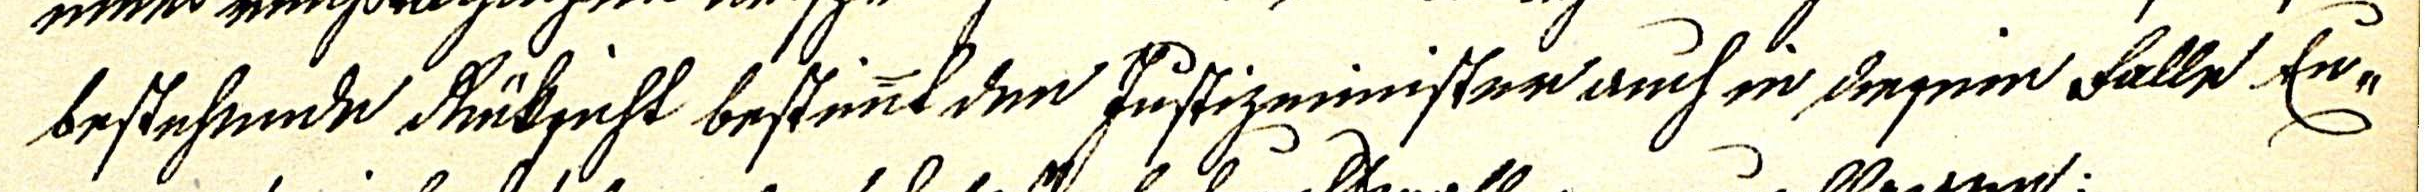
bestehende Rücksicht bestimmt den Justizminister auch in diesem Fale Eu¬
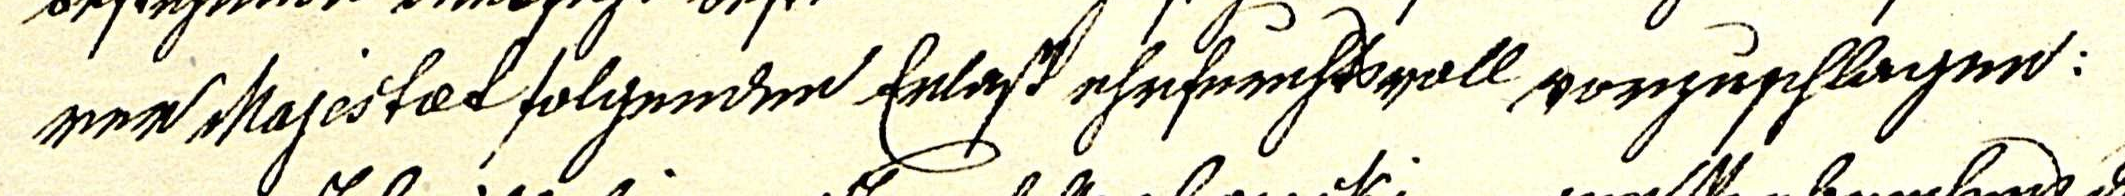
rer Majestaet folgenden Erlaß ehrfurchtsvoll vorzuschlagen:
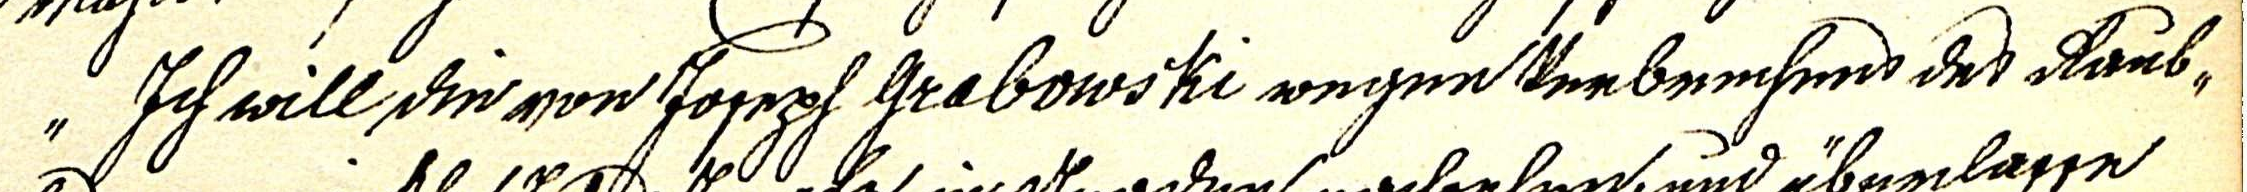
„Ich will die von Joseph Grabowski wegen Verbrechens des Raub¬
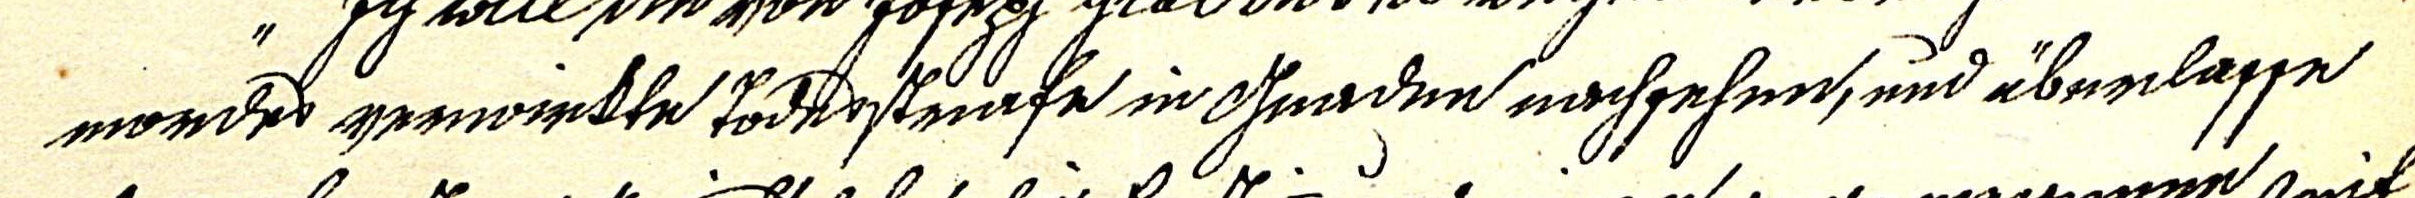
mordes verwirkte Todesstrafe in Gnaden nachsehen, und überlasse
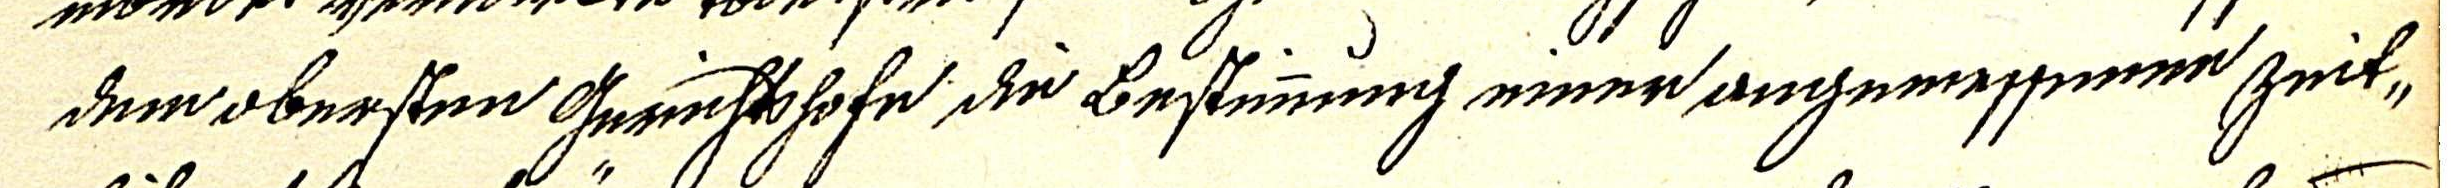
dem obersten Gerichtshofe die Bestimmung einer angemessenen Zeit¬
